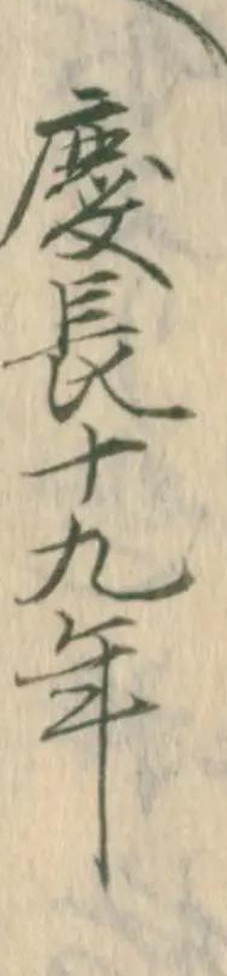慶長十九年
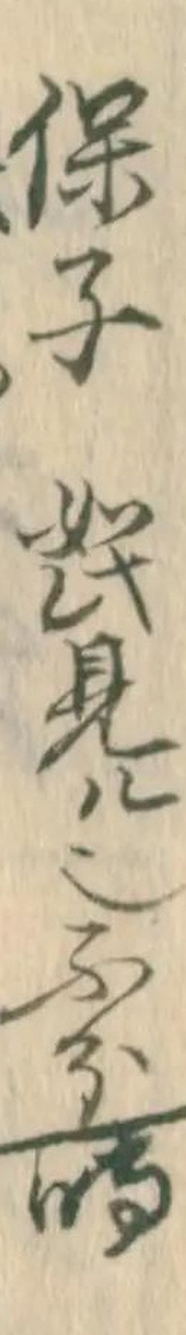保子如此見ル也不分明
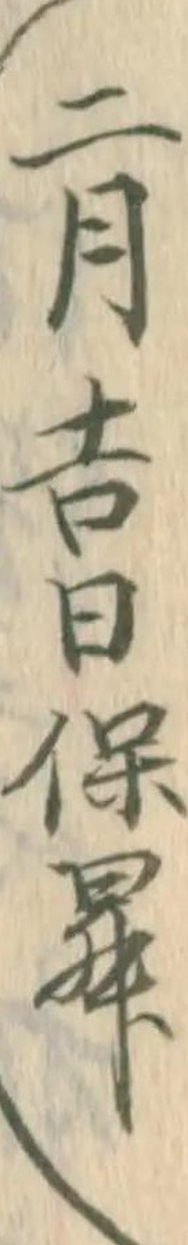二月吉日保昇

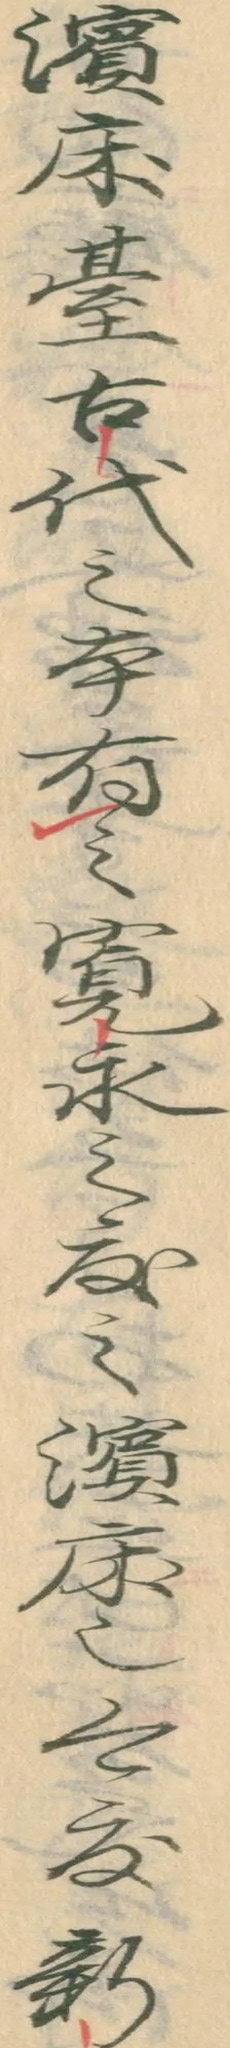浜床台古-代之本有之寛-永之度之浜床也今度新-
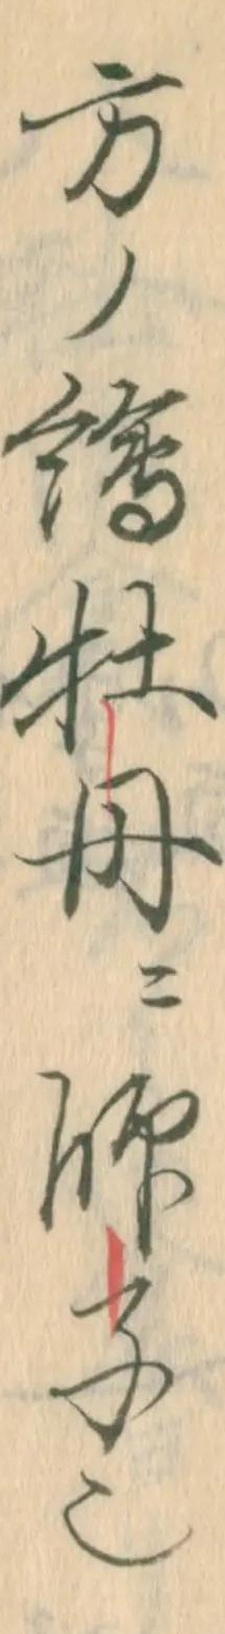方ノ絵牡-丹ニ師-子也
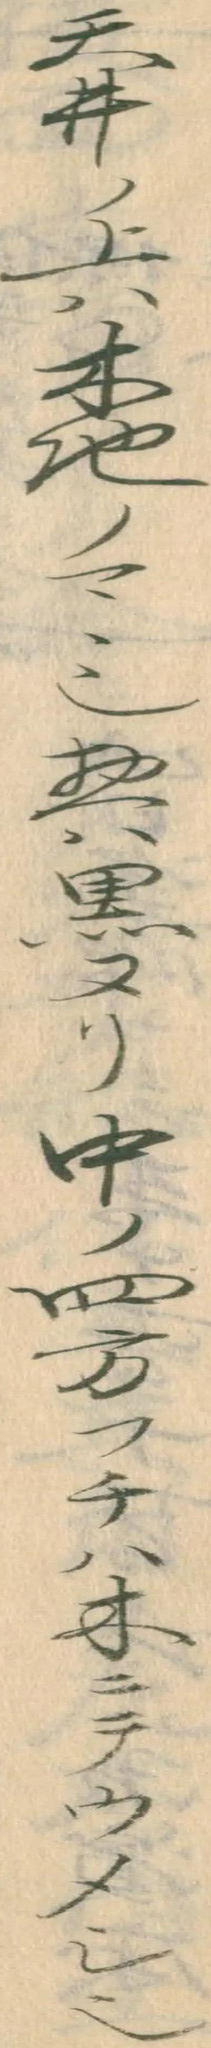天井ノ上ハ木地ノマヽ也惣ハ黒ヌリ中ノ四方フチハ木ニテウメシ也
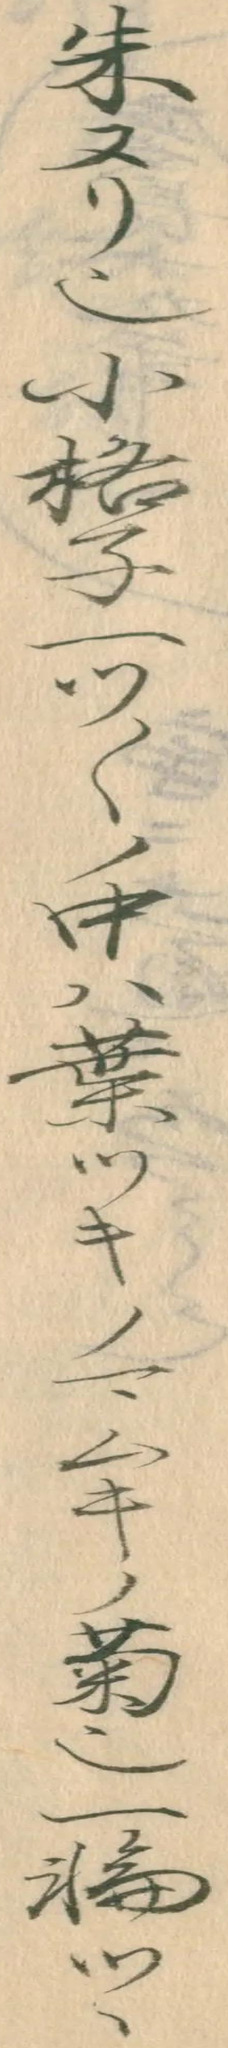朱ヌリ也小格子一ツ〳〵ノ中ハ葉ツキノマムキノ菊也一輪ツヽ
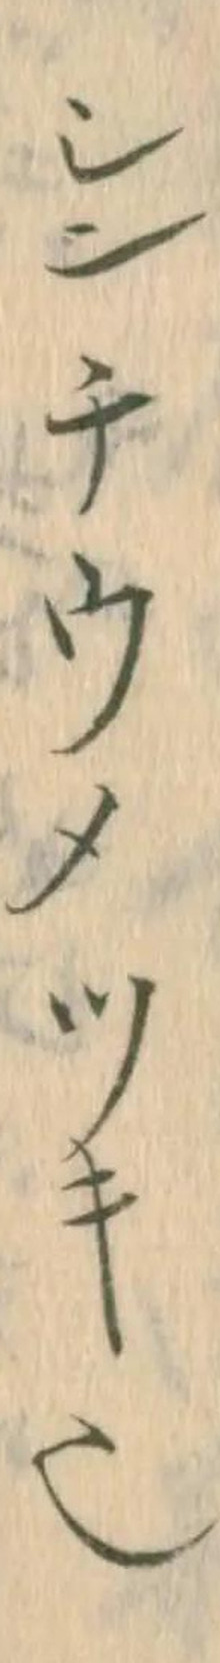シンチウメツキ也
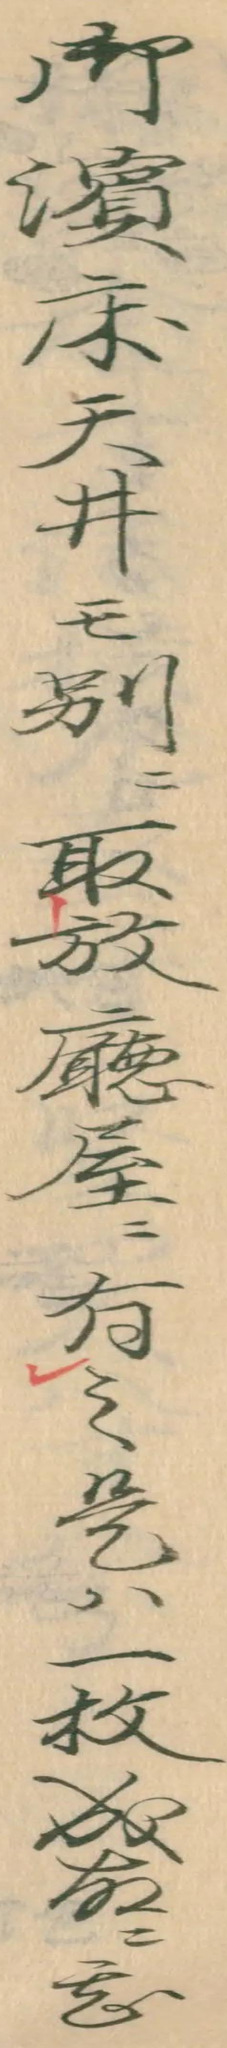御浜床天井モ別ニ取_放庁屋ニ有之是ハ一枚成故ニ甚
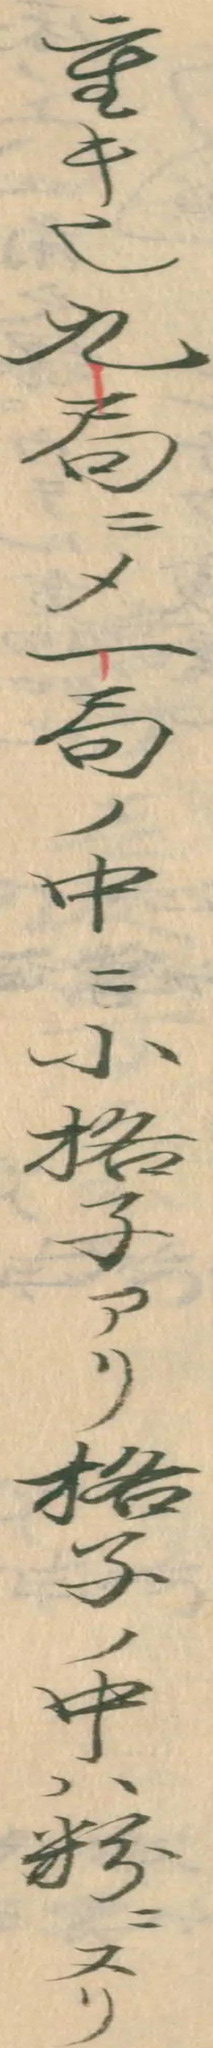重キ也九-局ニシテ一-局ノ中ニ小格子アリ格子ノ中ハ粉ニヌリ
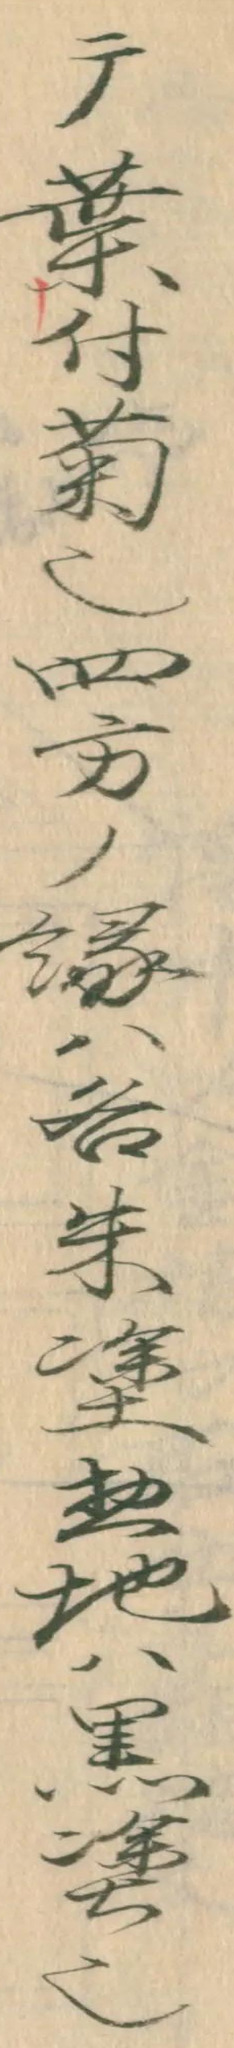テ葉_付菊也四方ノ縁ハ各朱塗惣地ハ黒塗也
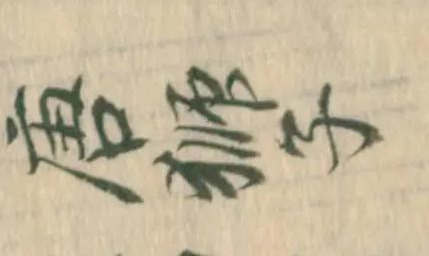唐獅子
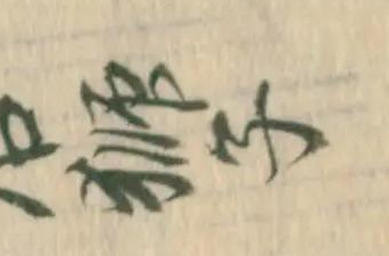唐獅子
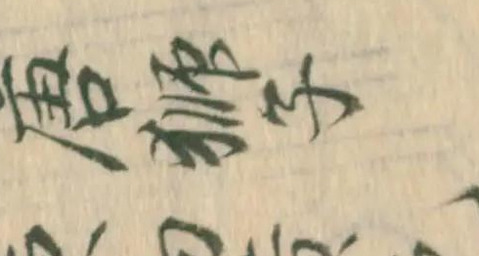唐獅子
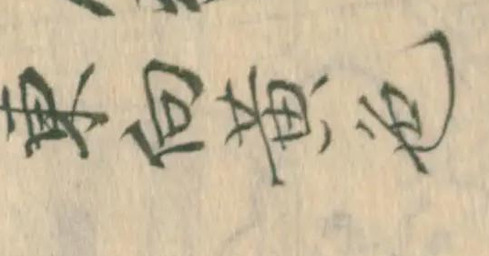東向黄色
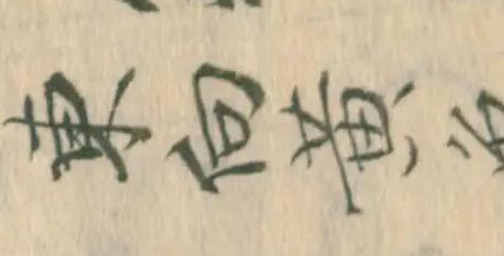東向黄色
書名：賀茂社記録. 第15冊
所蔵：国立国会図書館 National Diet Library, JAPAN
